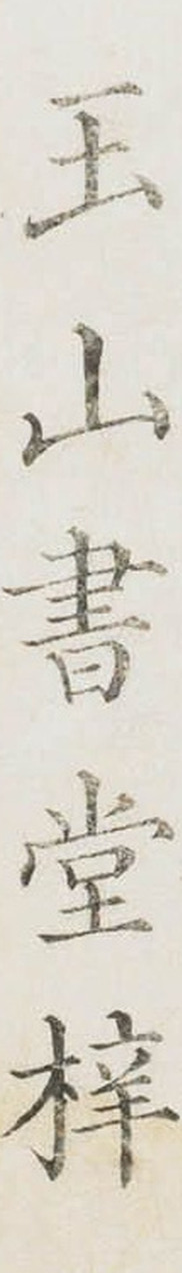玉山書堂梓

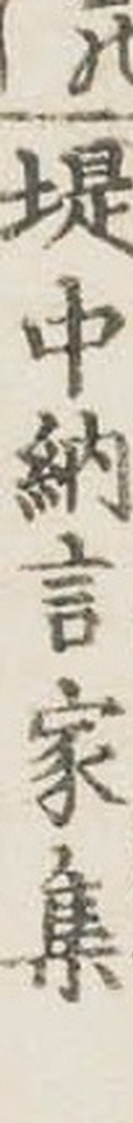堤中納言家集

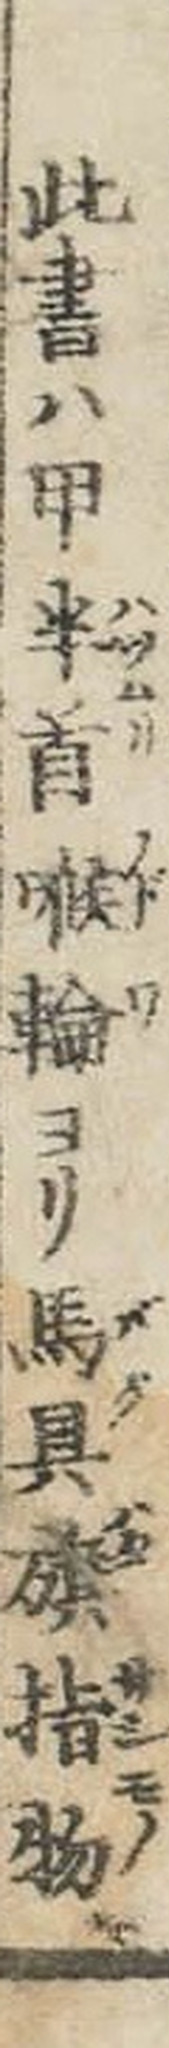此書ハ甲半首喉輪ヨリ馬具旗指物

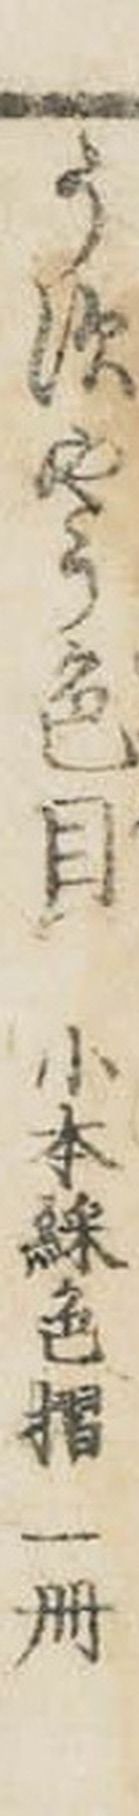うすやう色目小本綵色摺一冊
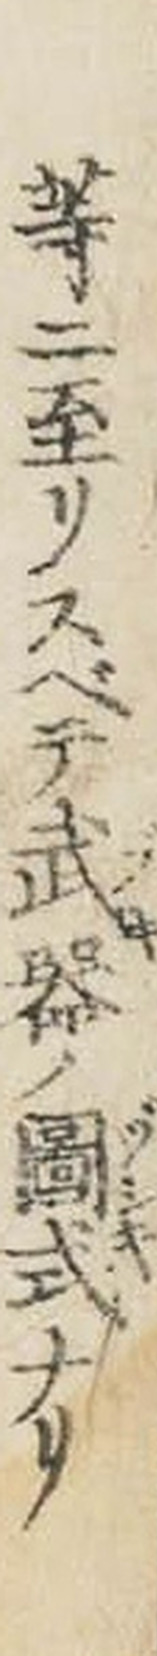等ニ至リスベテ武器ノ図式ナリ
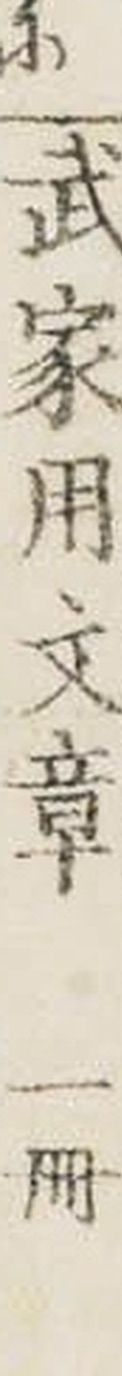武家用文章一冊
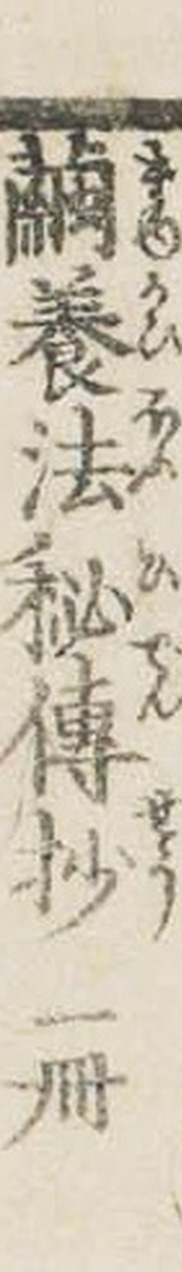繭養法秘伝抄一冊

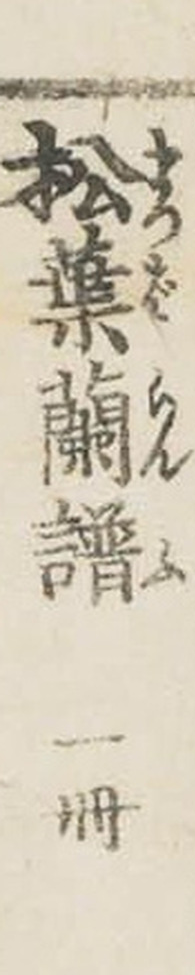、松葉蘭譜一冊
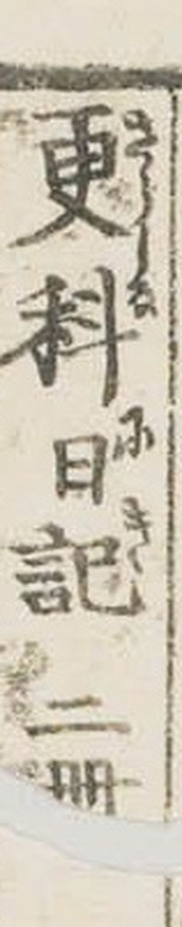更科日記二冊
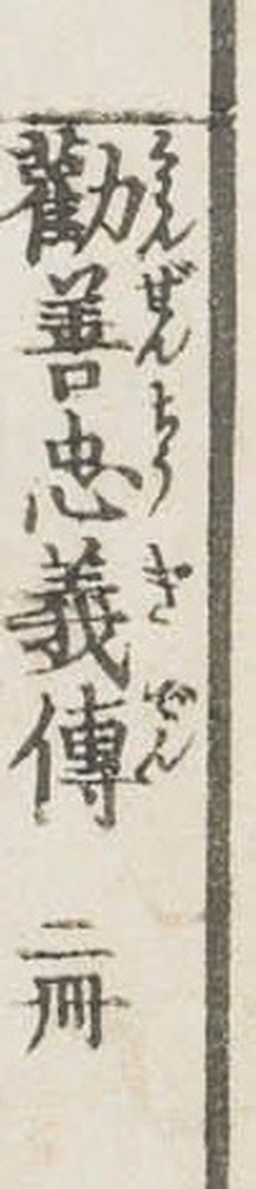勧善忠義伝二冊
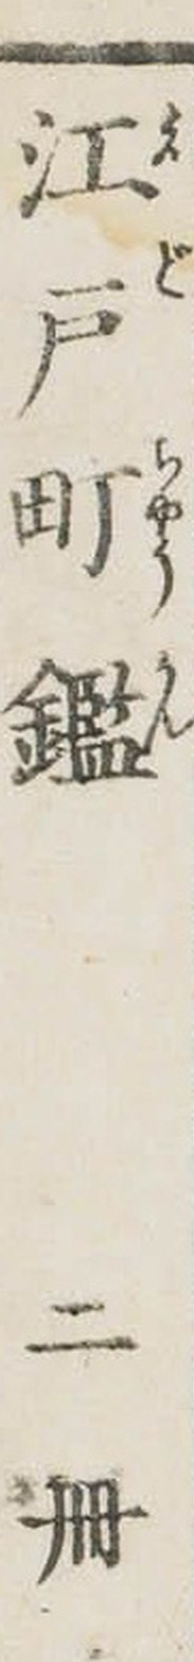江戸町鑑二冊
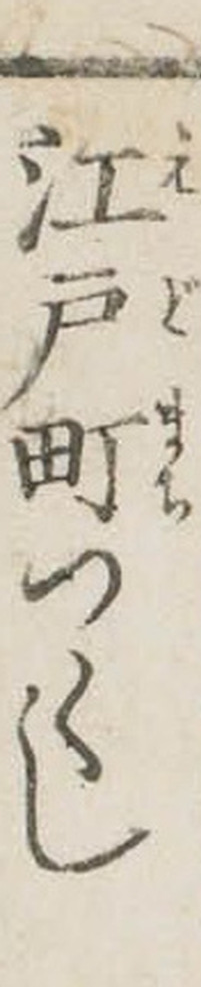江戸町つくし一冊
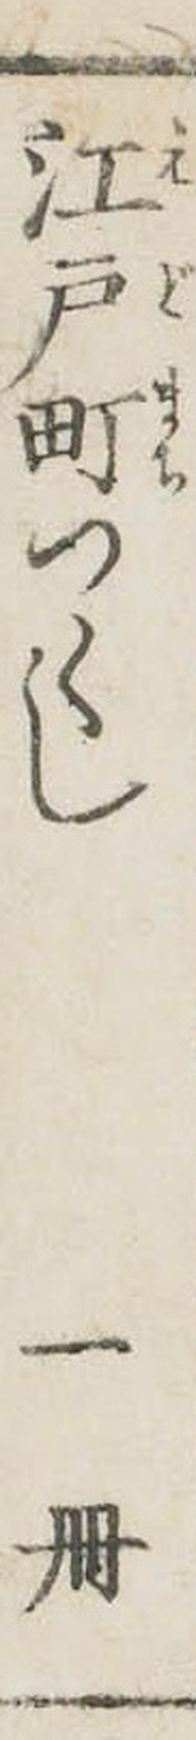江戸町つくし一冊
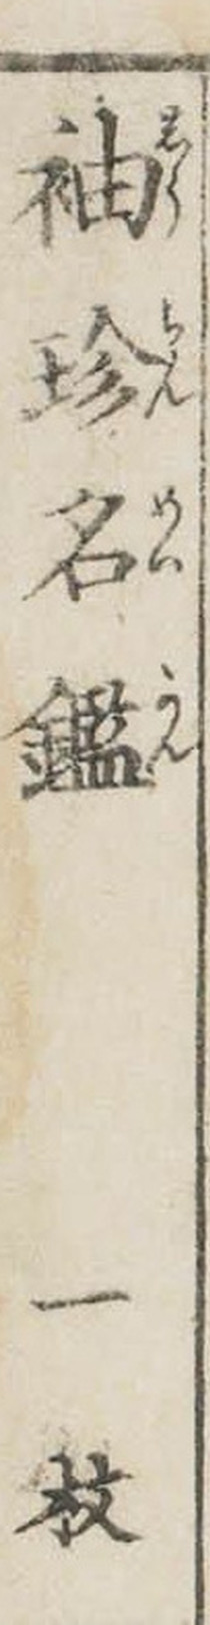袖珍名鑑一枚

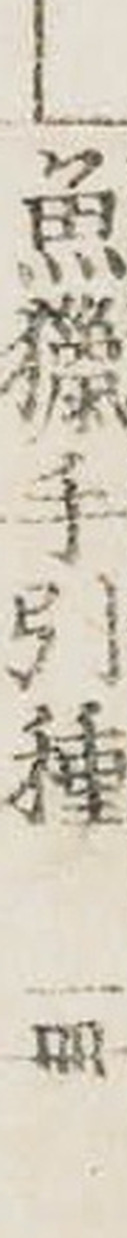魚猟手引種一冊
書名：源氏百人一首
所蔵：東京学芸大学教育コンテンツアーカイブ
